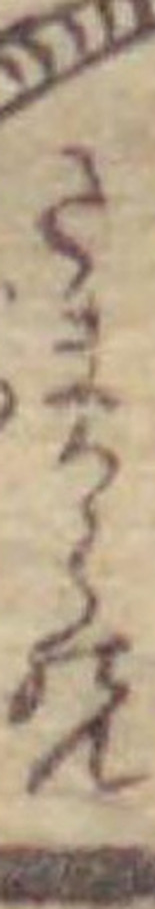たまからのん
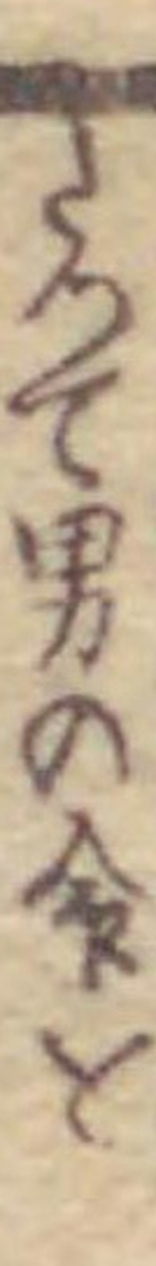たつて男の命を
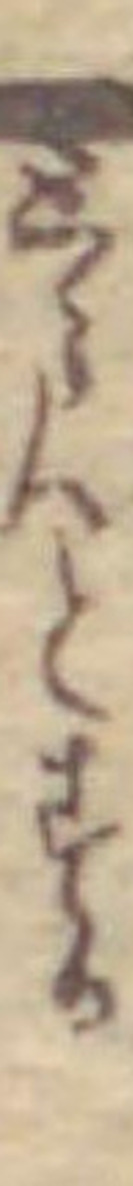とらんする
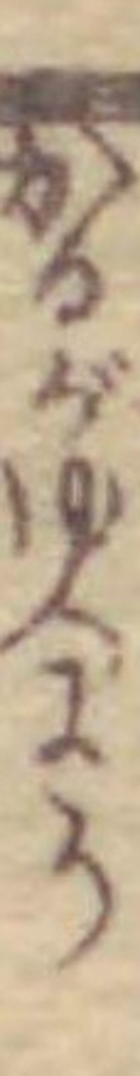かるがゆへにう
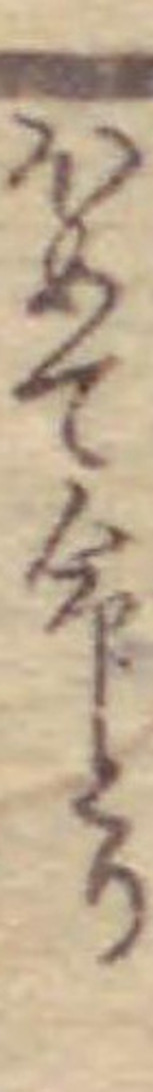ほめて命とり
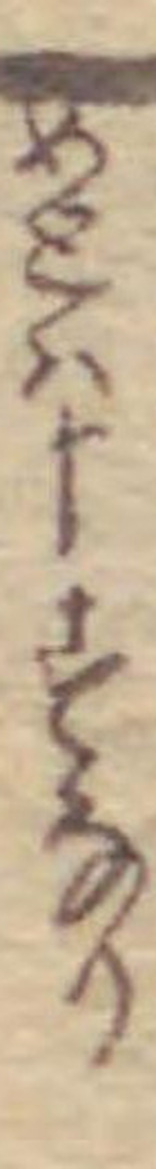めとは申すなり
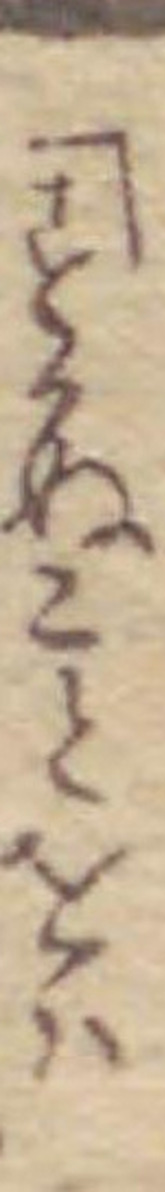〽すかぬことをは
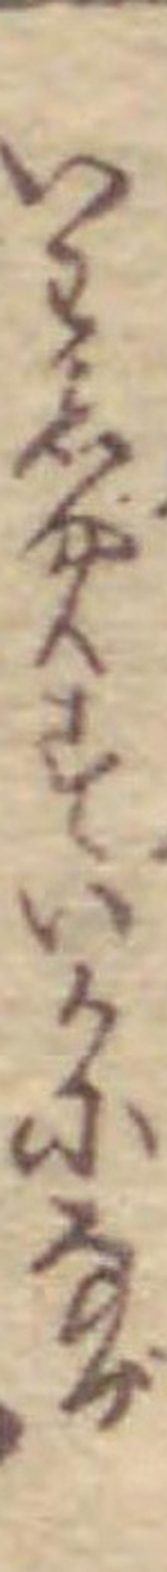いわしやんすいかになが
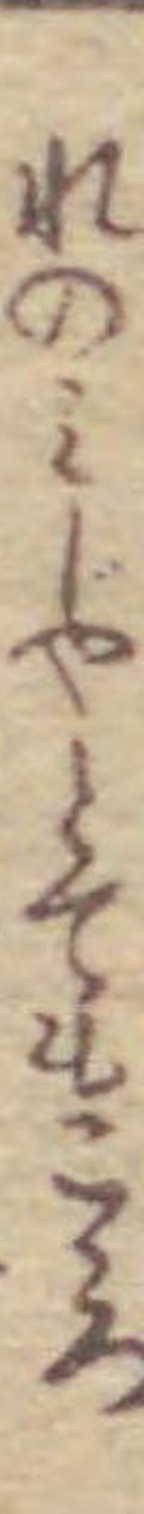れのみじやとてもこゝろ
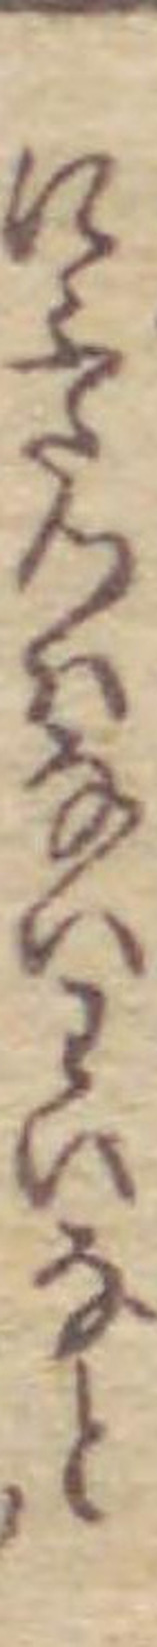にふたつはないわいなと
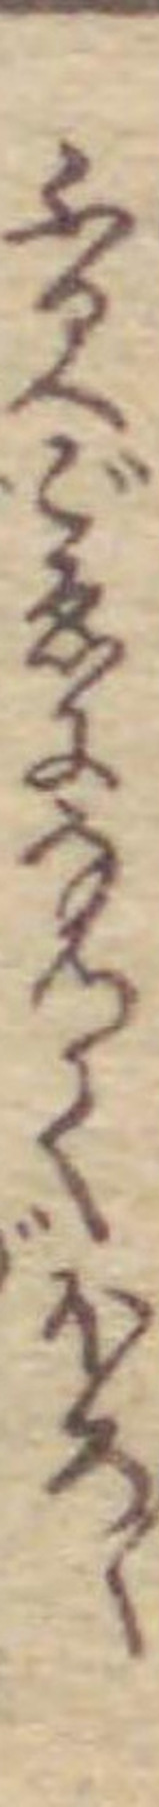ふるへごゑになつてほろ〳〵
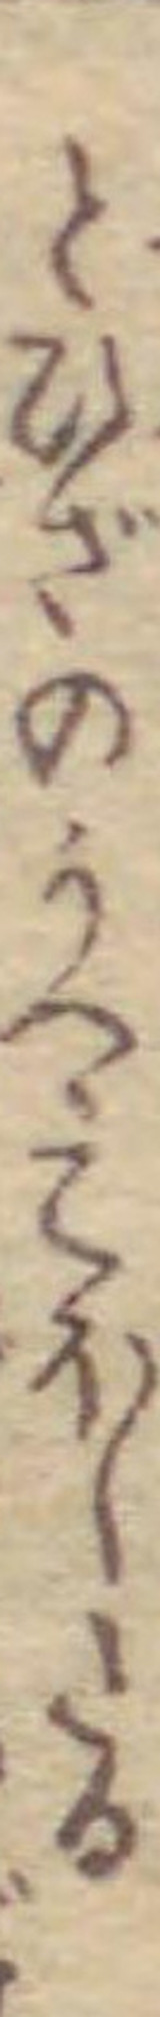とひざのうへゝこぼしたる
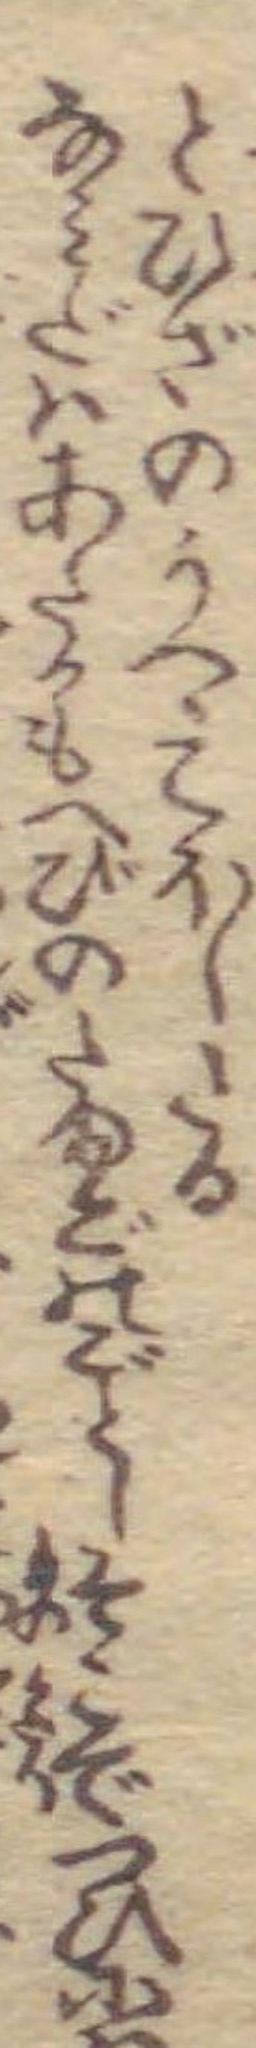なみだはあたかもへびのたまごのごとしそこでつひには
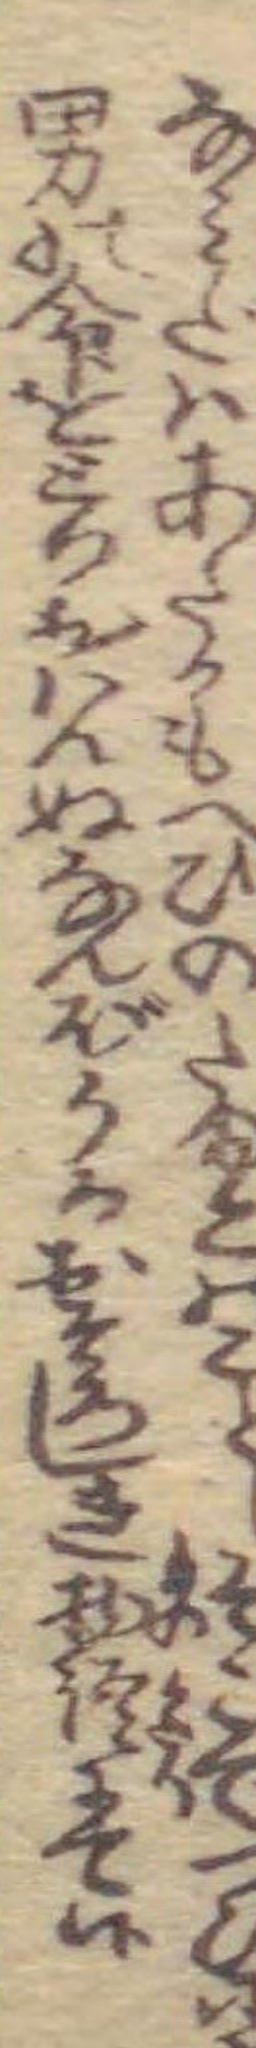男の命をとりおはんぬなんぼうかおそろしき物語にて候

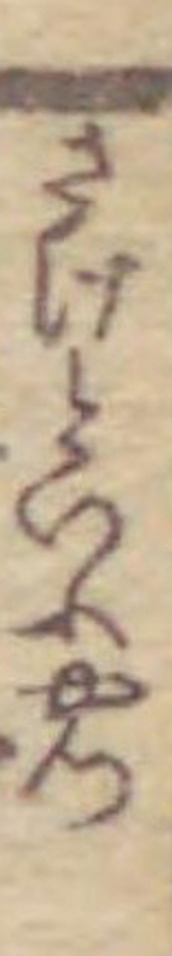さけといふやつ
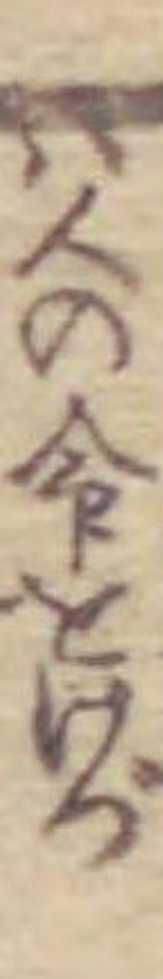は人の命をけづ
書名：御誂染長寿小紋 : 3巻
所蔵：国立国会図書館 National Diet Library, JAPAN
